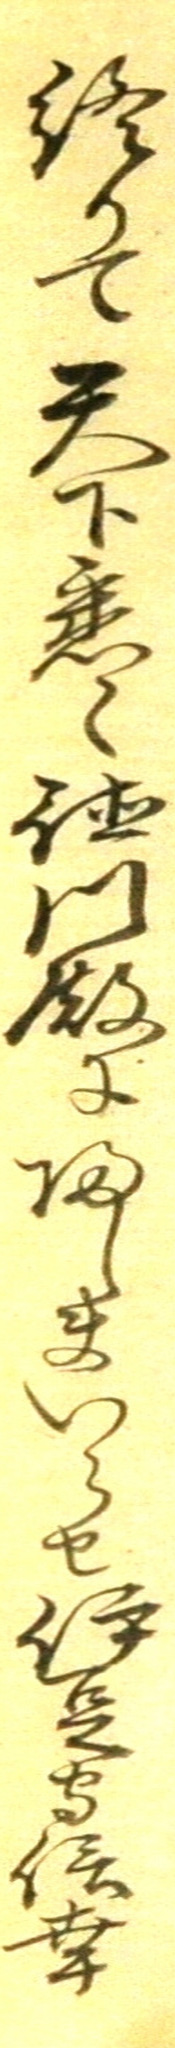終りて天下悉く徳川殿に帰しまいらせ伊豆守信幸

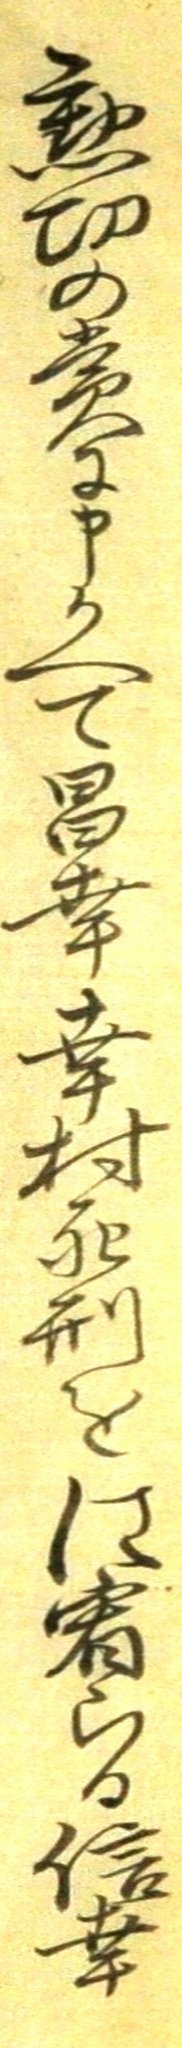勲功の賞に申かへて昌幸幸村死刑をは宥らる信幸
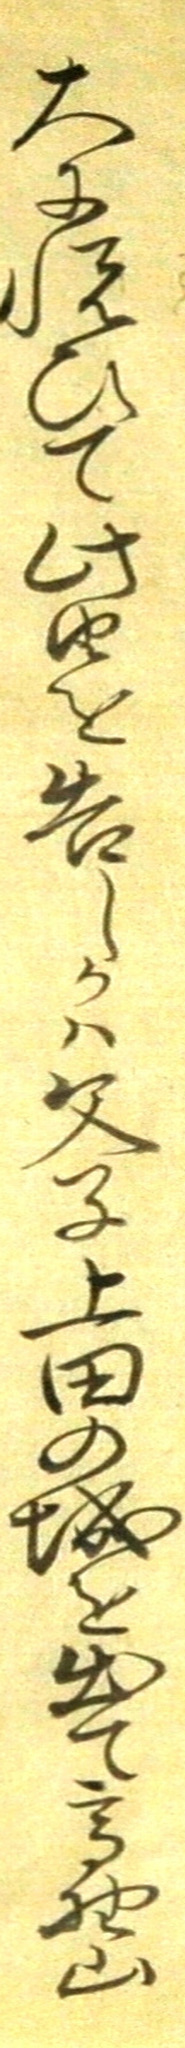大に悦ひて此由を告しかは父子上田の城を出て高野山
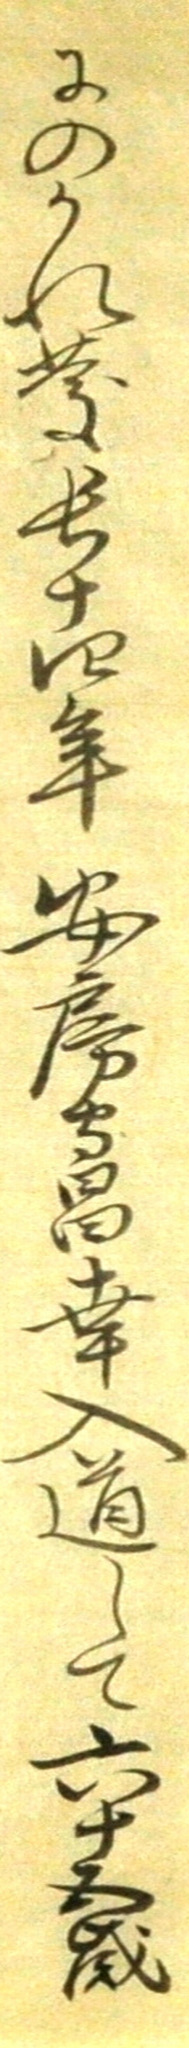にのかれ慶長十四年安房守昌幸入道して六十五歳
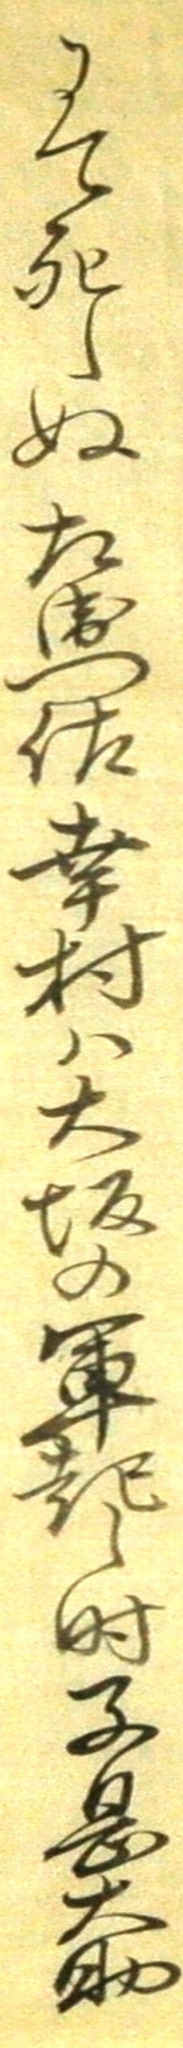にて死しぬ左衛門佐幸村は大坂の軍起し時子息大助
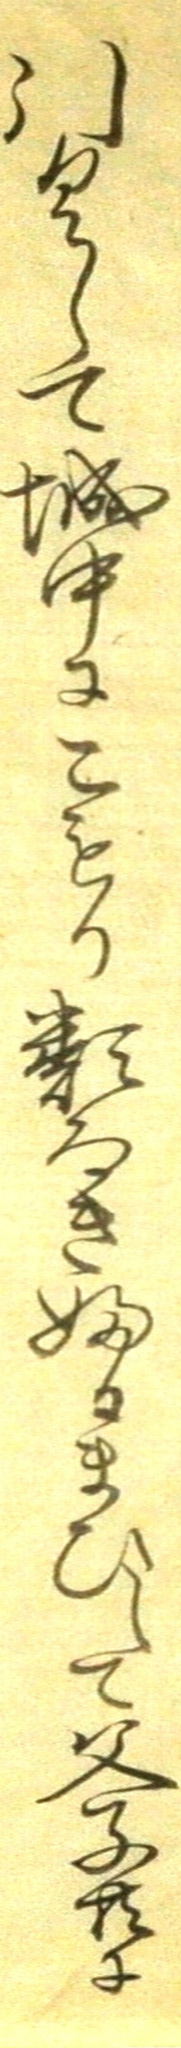引具して城中にこもり類なきふるまひして父子共に
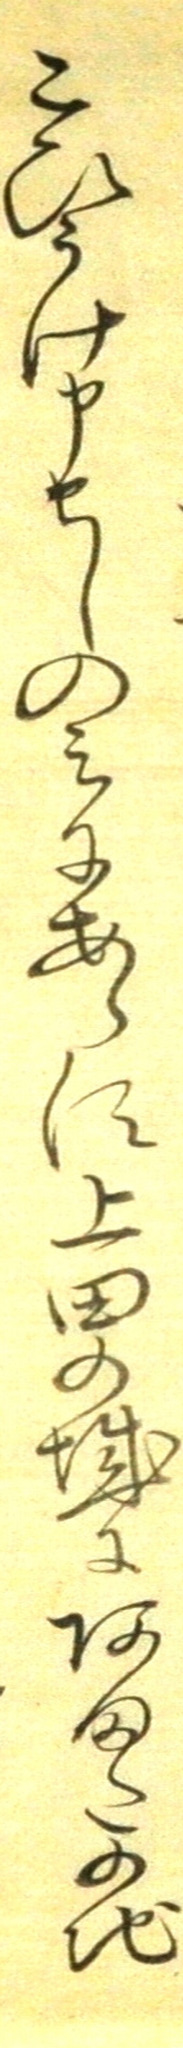こひうけ申せしのみにあらす上田の城にあまたの地
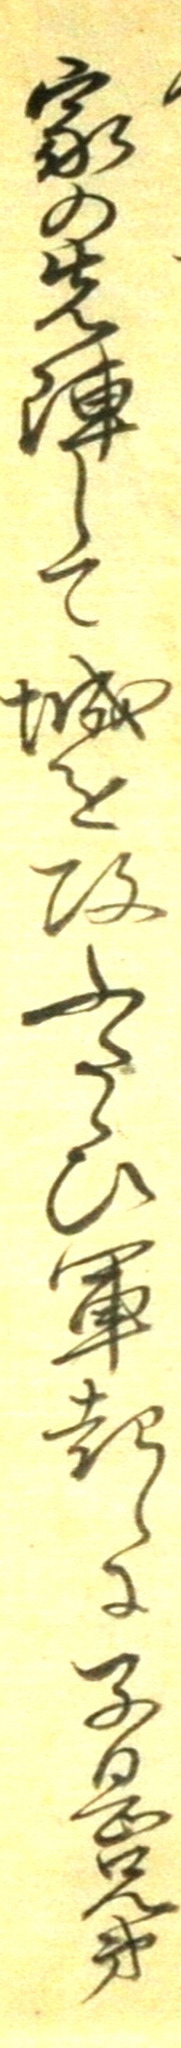家の先陣して城を攻ふたゝひ軍起しに子息兄弟
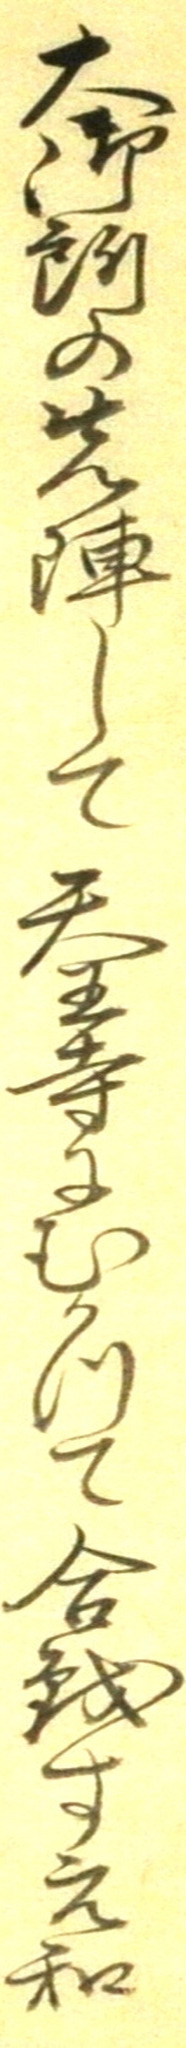大御所の先陣して天王寺にむかつて合戦す元和
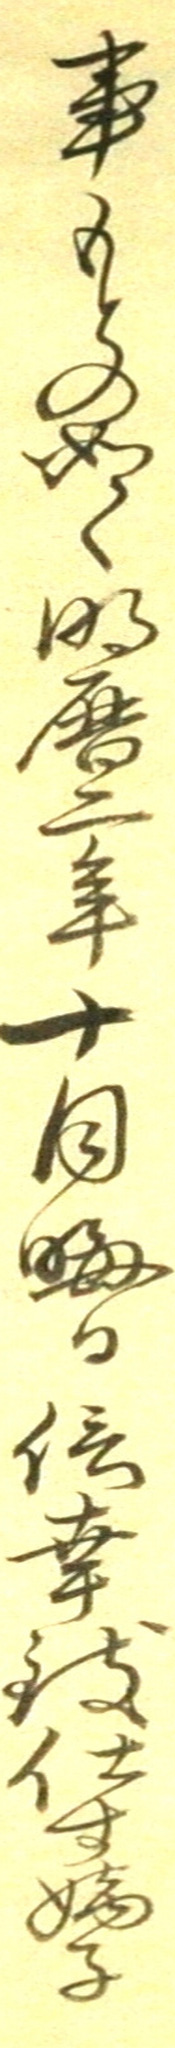事もとの如く明暦二年十月晦日信幸致仕す嫡子
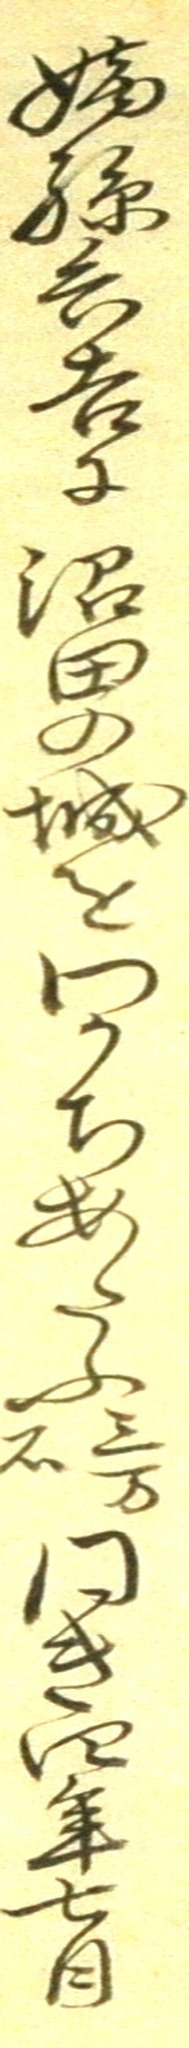嫡孫兵吉に沼田の城をわかちあたふ三万石同き四年七月
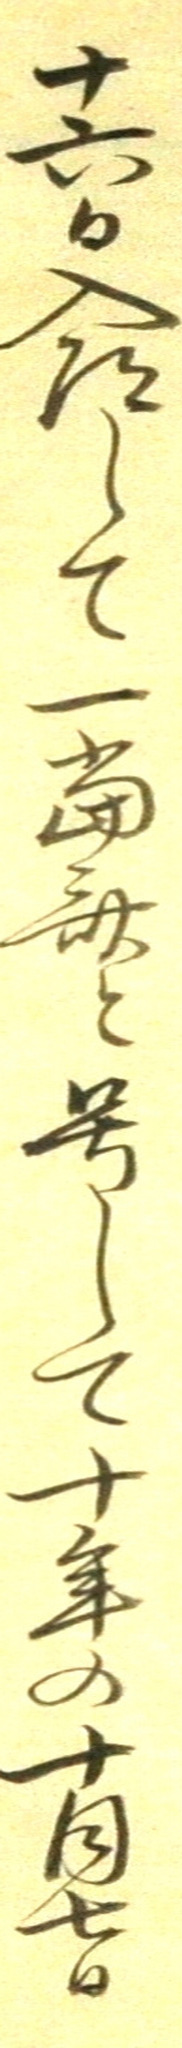十六日入道して一当斎と号して十年の十月七日
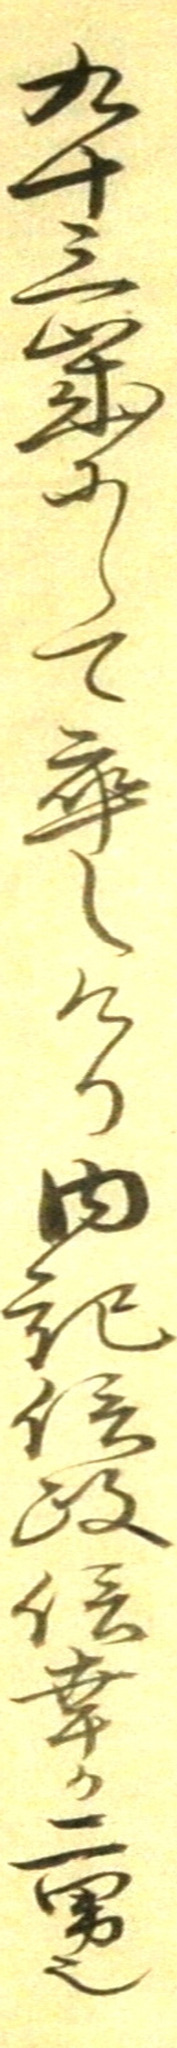九十三歳にして卒しけり内記信政信幸か二男也
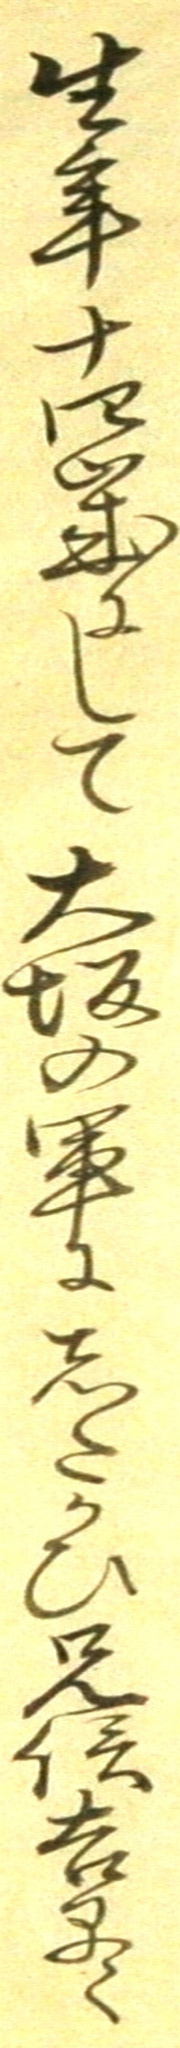生年十四歳にして大坂の軍にしたかひ兄信吉早く
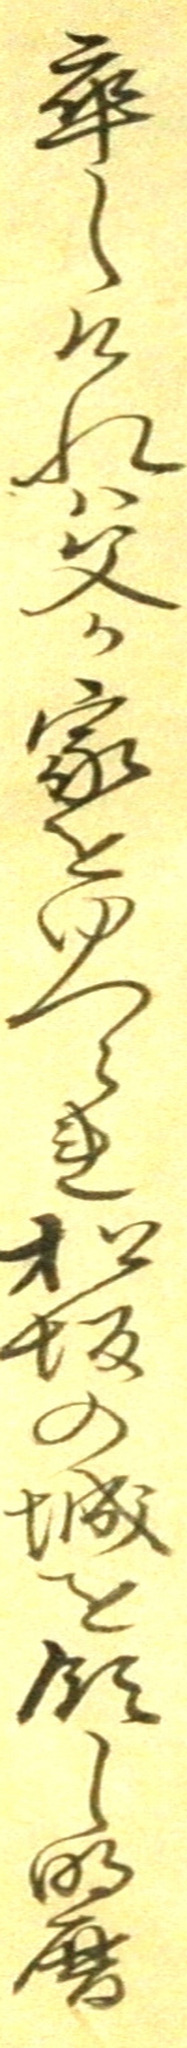卒しけれは父か家をゆつられ松坂の城を領し明暦
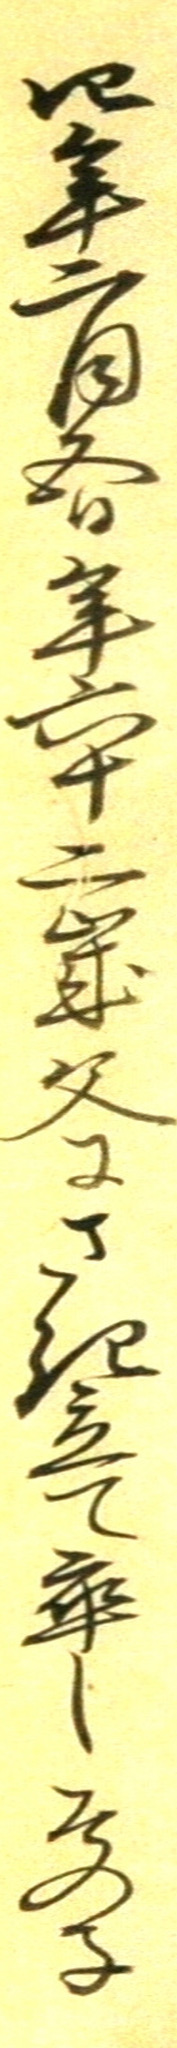四年二月五日年六十二歳父にさき立て卒しその子
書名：藩翰譜（九・上）
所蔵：伊那市立高遠町図書館・合同会社AMANE
